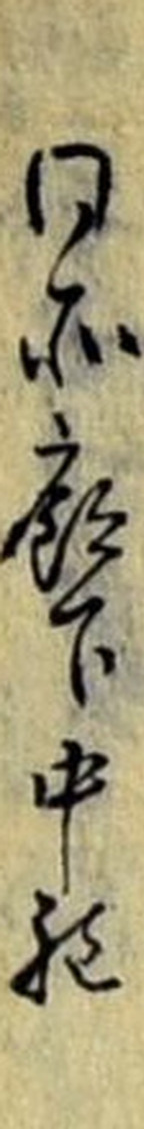同所廊下中程一

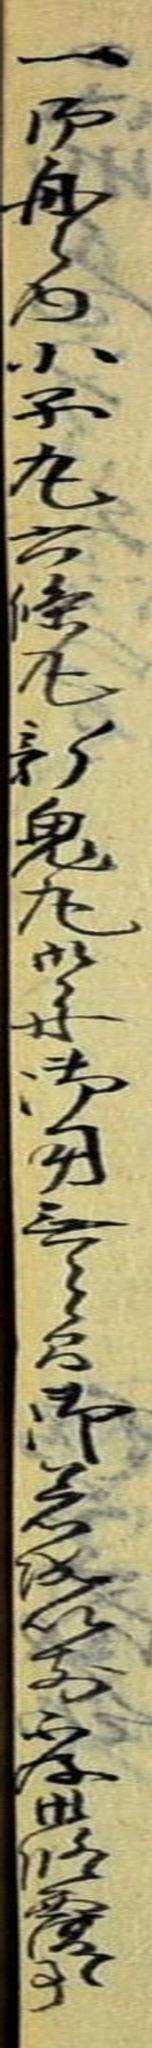一御舟之内小子丸六条丸新鬼丸御舟御用無之候間御着城以前不及御修覆候事

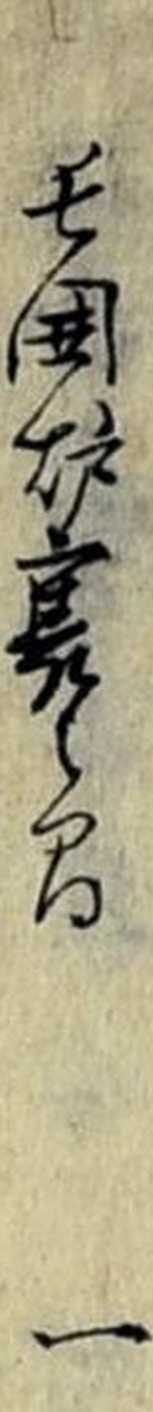長囲炉裏之間一
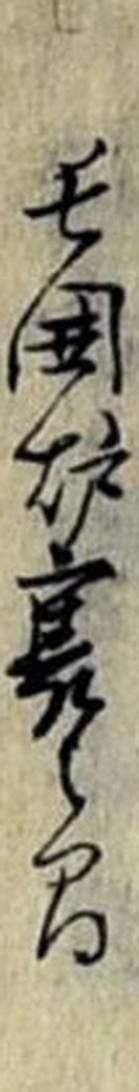長囲炉裏之間一
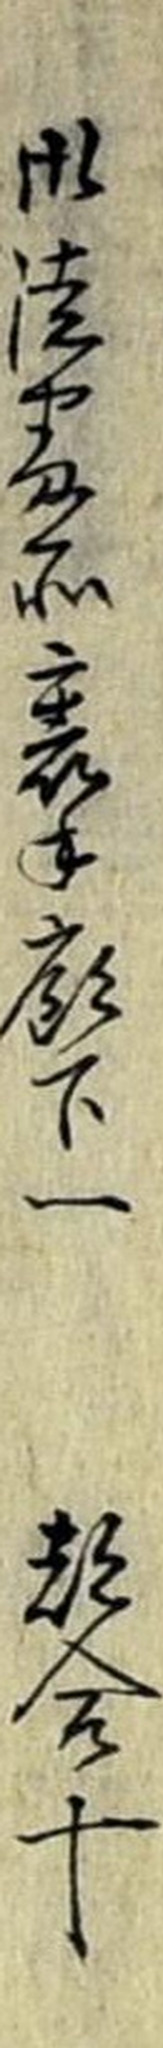御徒番所裏手廊下一都合十
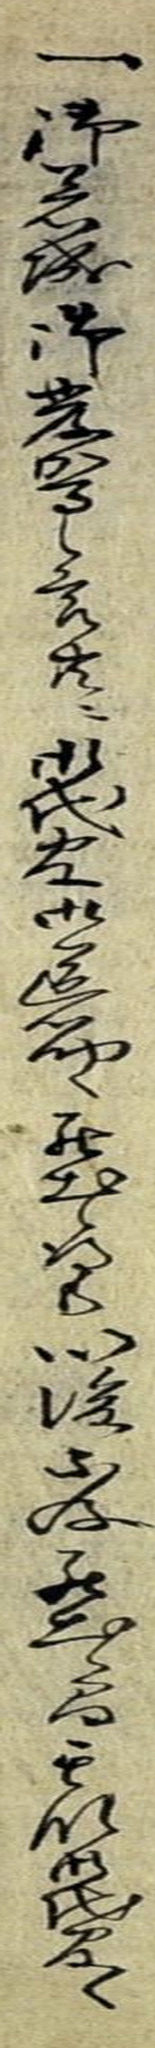一御着城御発駕之節共ニ御代官御道筋へ罷出候得共以後不及罷出候間其段御代官へ
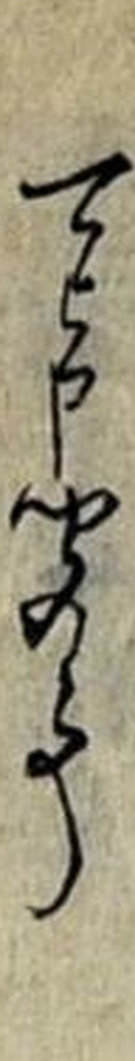可被申聞事
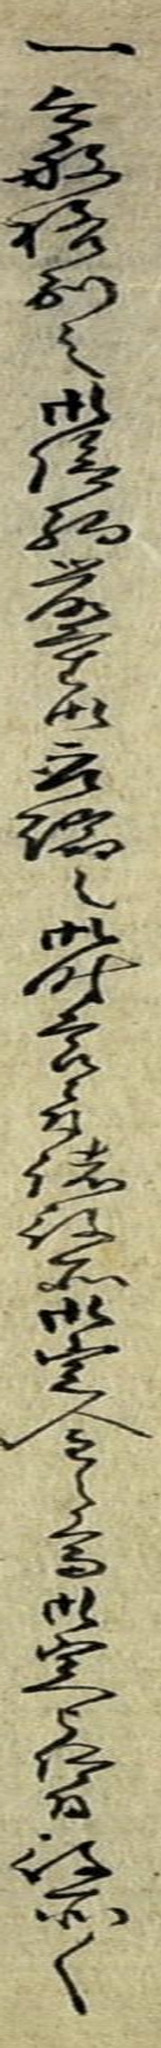一今般格別之御倹約厳重御取縮之御時節ニ付諸役所御定金之高御定被仰付役所〳〵
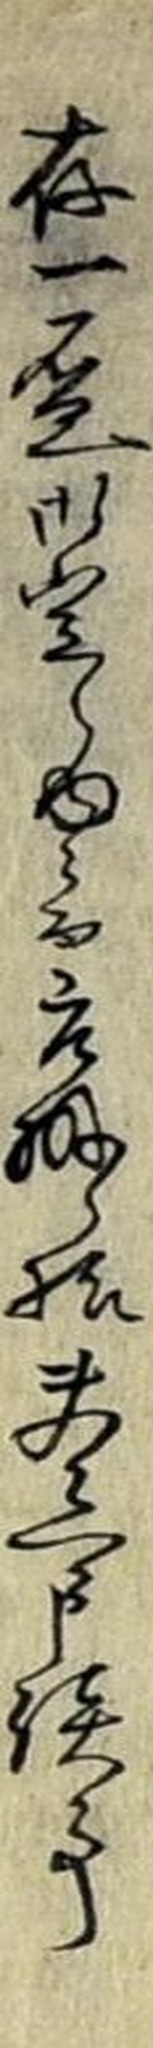存一盃御定之内ニ而取扱候様夫々可申談事
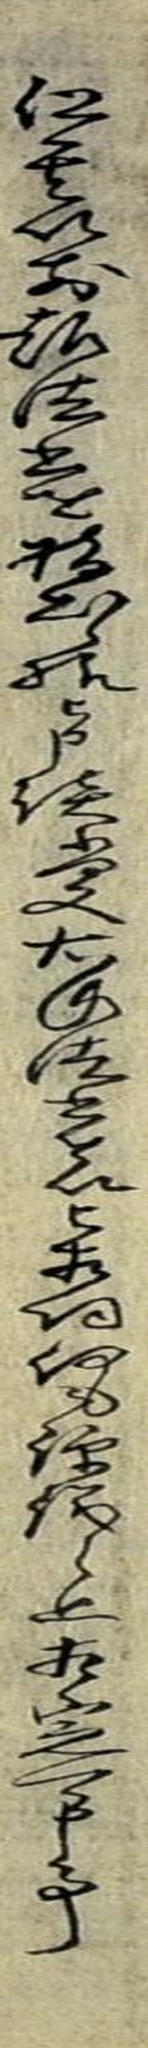但其以前趣法書を指出候様被申談尚又右趣法書を以被相伺何も評議之上相定可申事
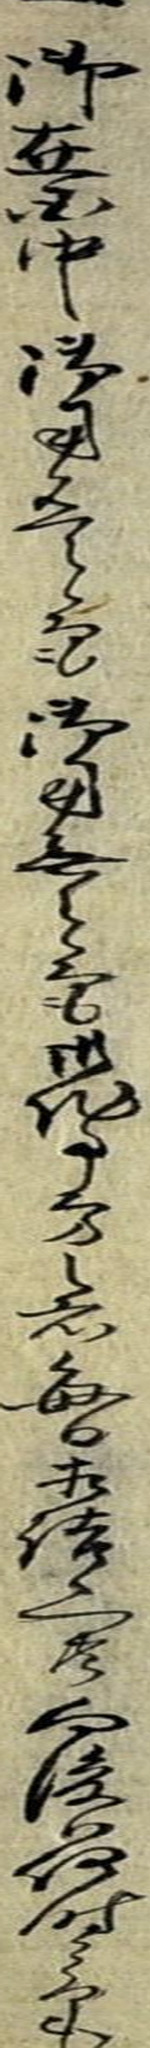一御在国中御用有之候而も御用無之候而も御作事方之者毎日相詰候へ共向後ハ何時ニ而も
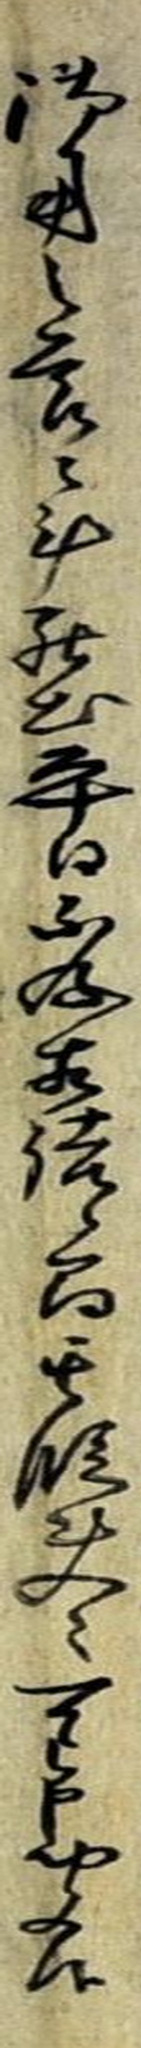御用之節ニ斗罷出平日不及相詰候間其段夫々可被申聞候
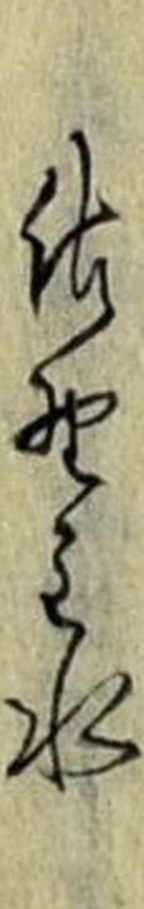佐野主水
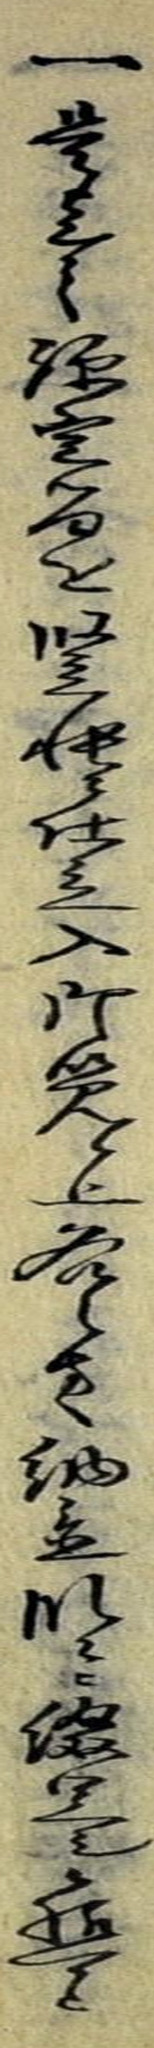一是迄之評定留を竪帳ニ仕立入御覧候上各之方へ納置段々ニ綴足シ候様可被
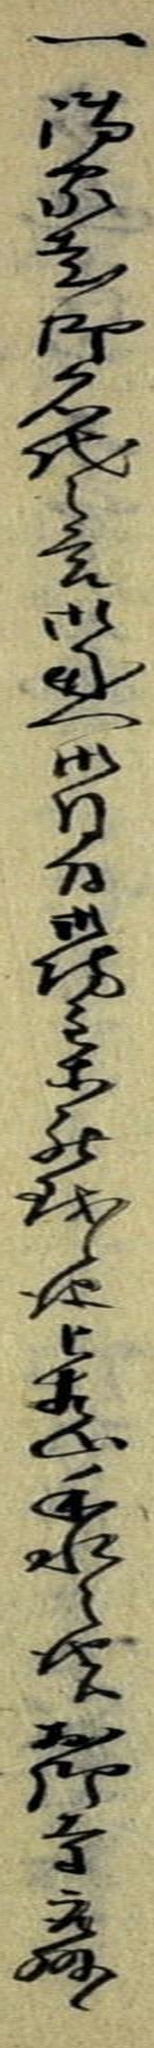一御家老御名代之節御用人御目付御坊主等罷越候儀被相止手水之儀ハ於御寺取扱候
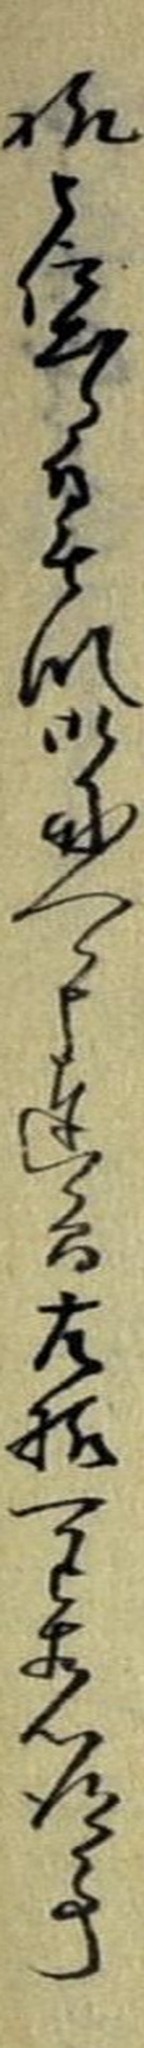様被仰出候ニ付其段御用人へ申達候間左様可被相心得候事
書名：命令之部 三
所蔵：福井県文書館 Fukui Prefectural Archives
